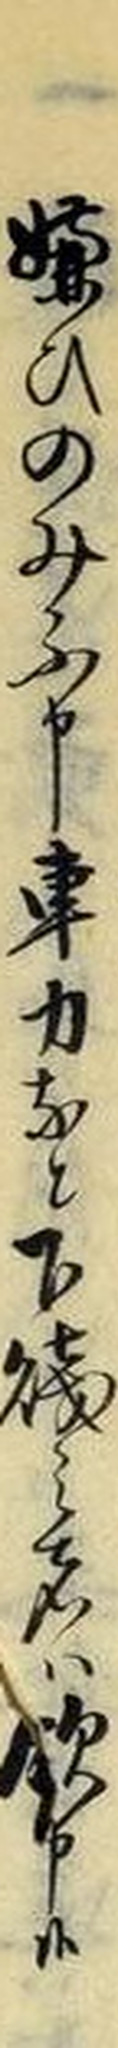嫌ひのみ不申車力なと下賤之者ハ飲申候
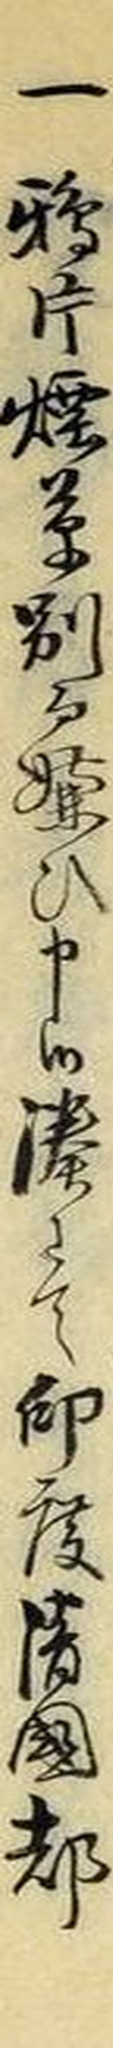一鴉片煙草別而嫌ひ申湊にて印度清国都
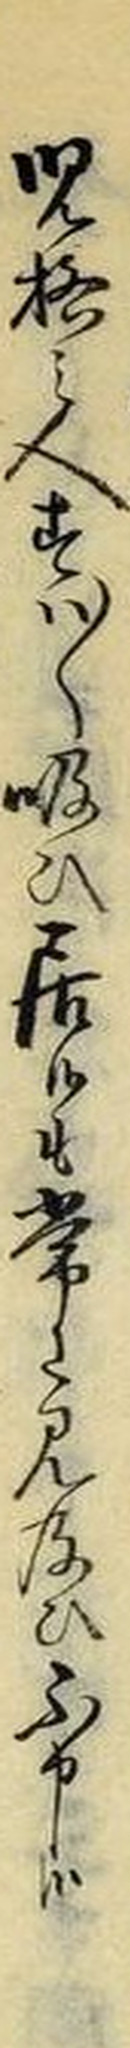児格之人すハ〳〵吸い居候も常に見及ひ不申候
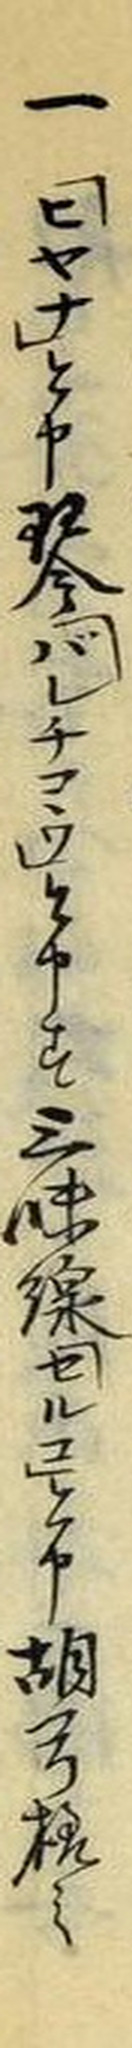一「ヒヤナ」と申琴「バレチコウ」と申す三味線「セルコ」と申胡弓様之
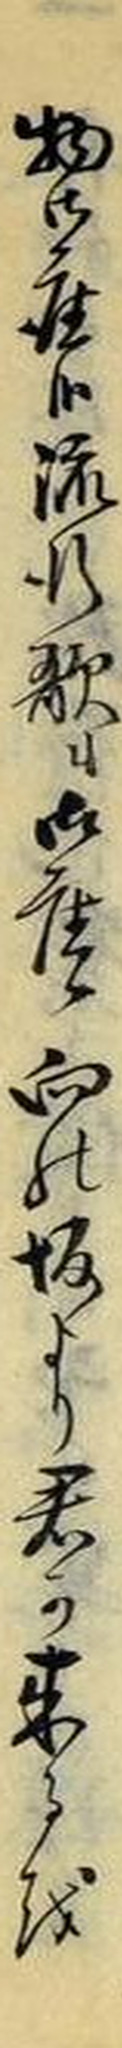物御座候流行歌も御座候向の坂より君か来るを
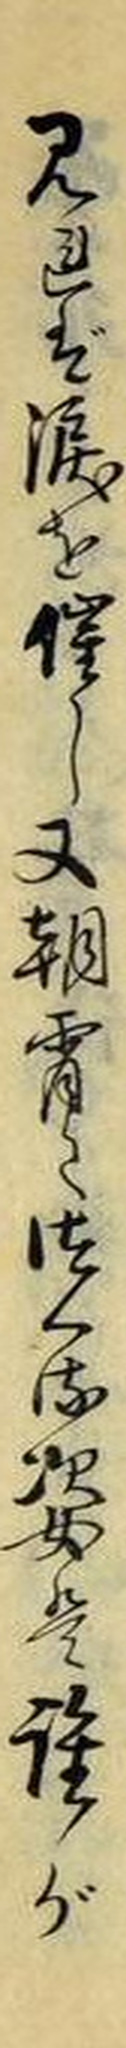見れば涙を催し又朝霄につくる姿は誰が

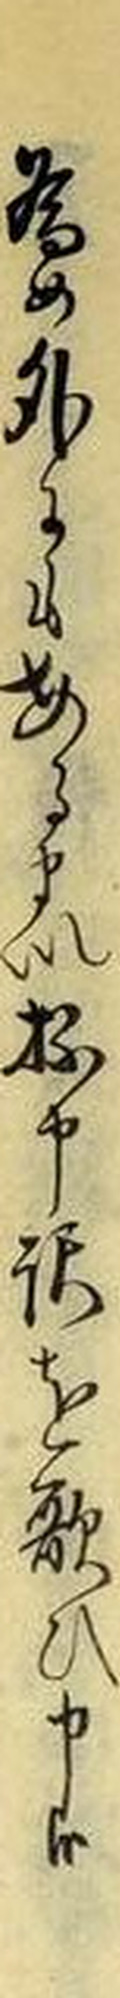為め外にもあるまい抔申訳を歌ひ申候
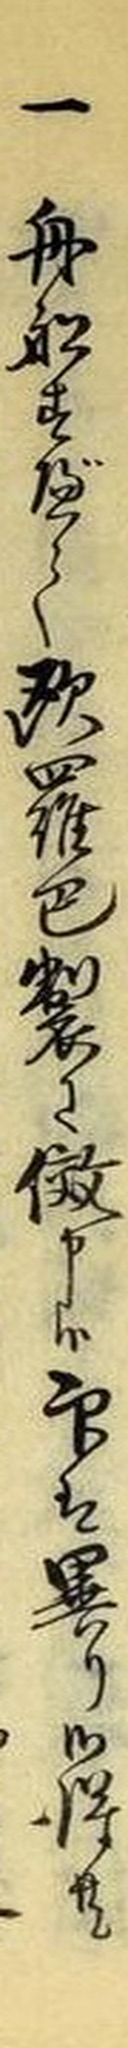一舟船すべて欧羅巴製に倣申候印は異り候得共
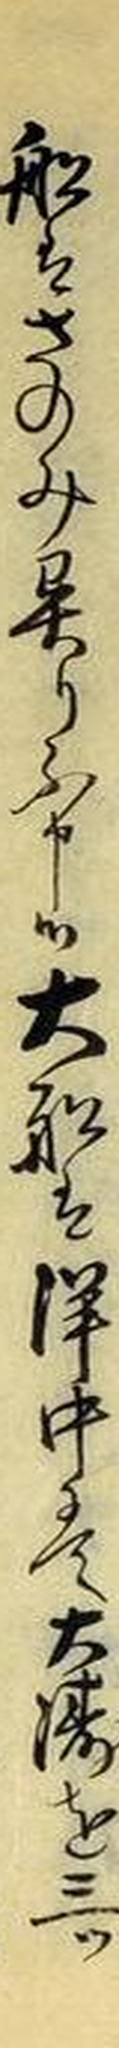船はさのみ異り不申候大船は洋中にて大涛を三ッ
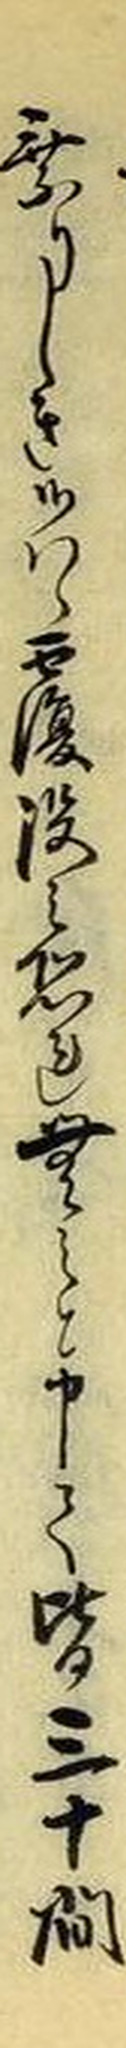乗りしき候ハゝ覆没之恐れ無之と申て皆三十間
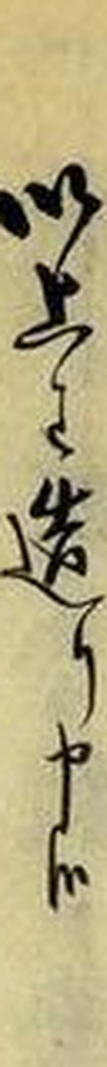以上に造り申候
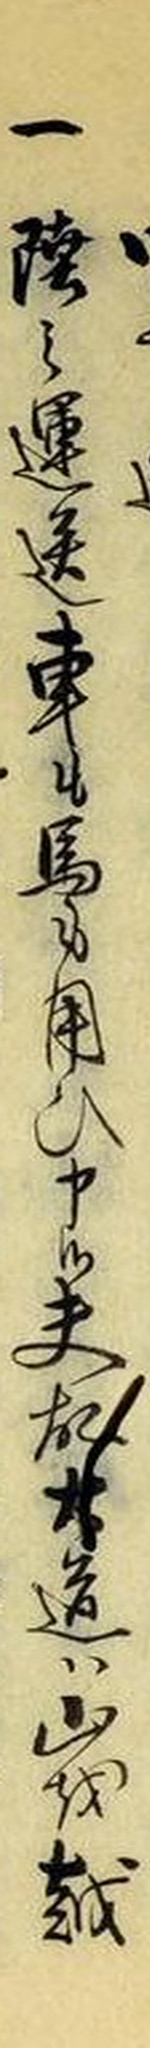一陸之運送車も馬も用ひ申候夫故大道ハ山を越
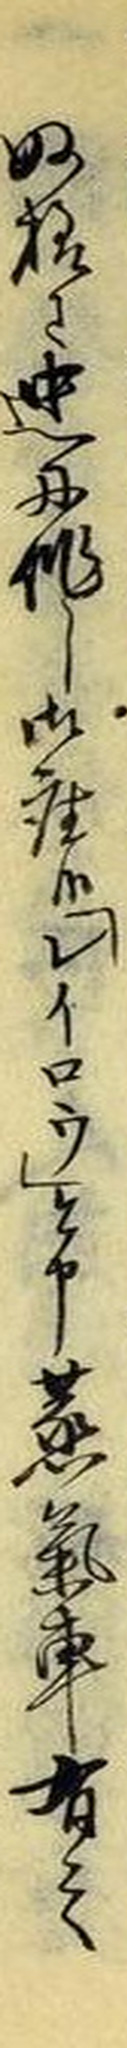ぬ様に迚に作し御座候「レイロウ」と申蒸気車有之
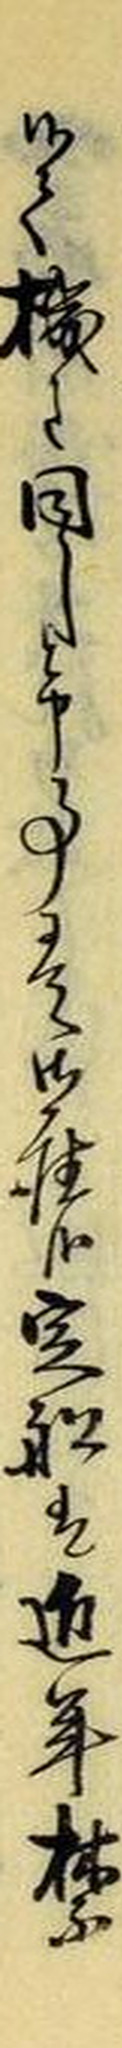候て機に同しと申事にて御座候定船は近年禁
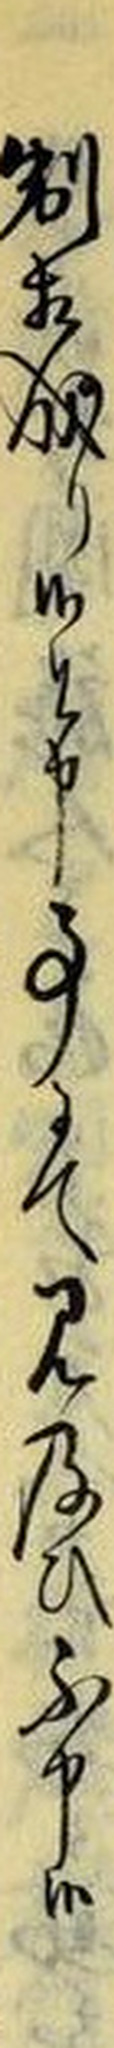制相成り候と申事にて見及ひ不申候
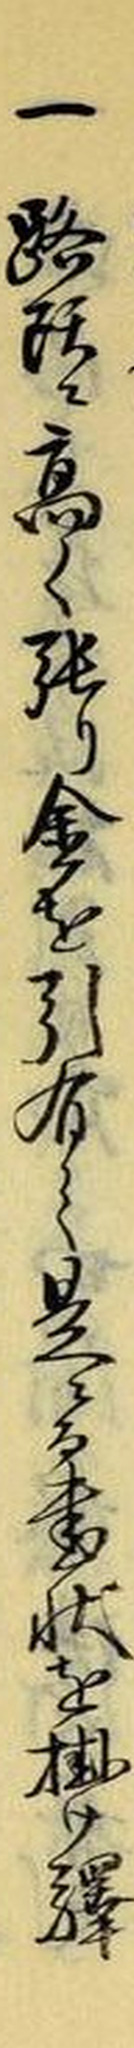一露頭ニ高く張り金を引有之是ニ而番状を掛け駅
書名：漂客談奇（備考雑録写8）
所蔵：福井県文書館 Fukui Prefectural Archives
